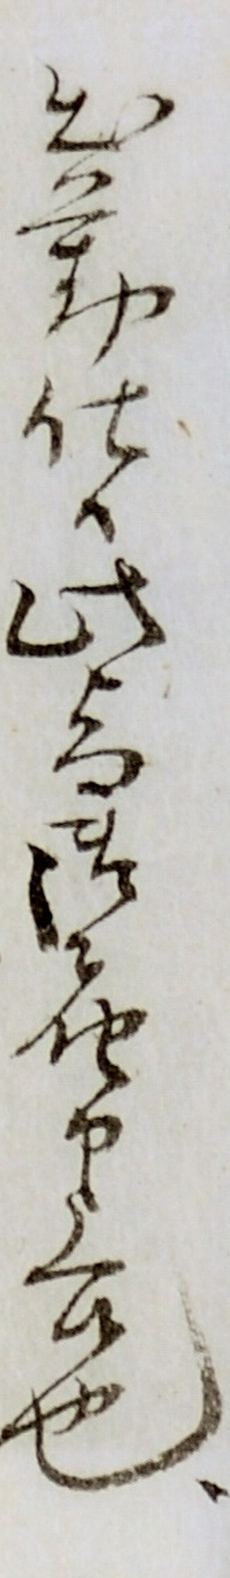出勤仕候此旨御届申上候也
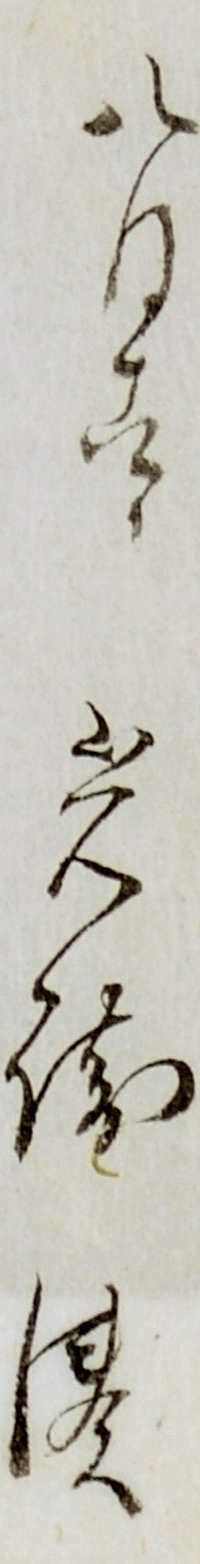八月十四日岩崎湊
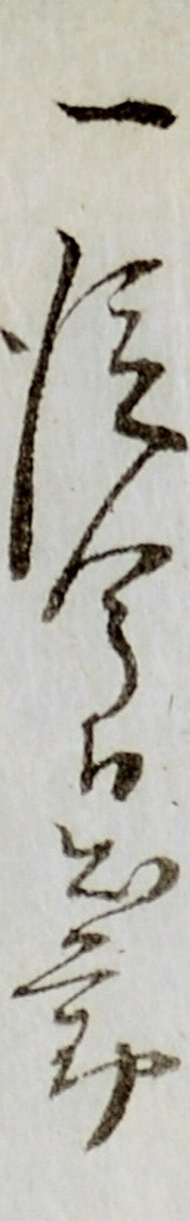一従今日出勤
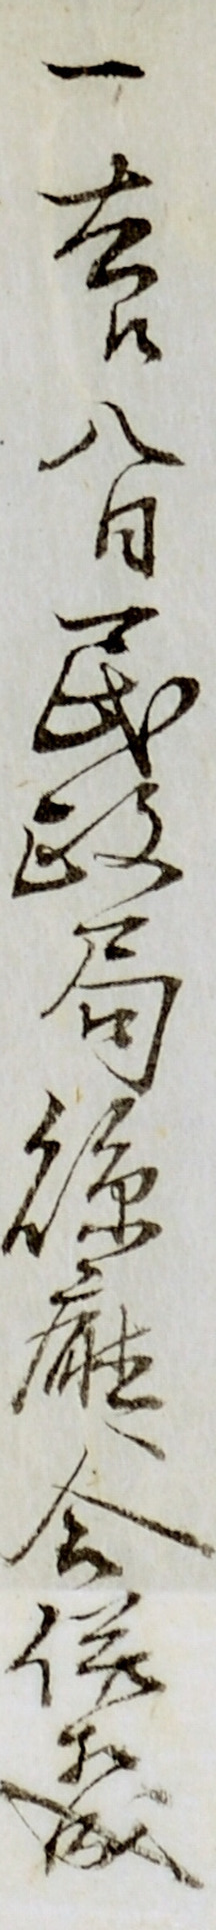一去ル八日民政局県庁へ合併相成
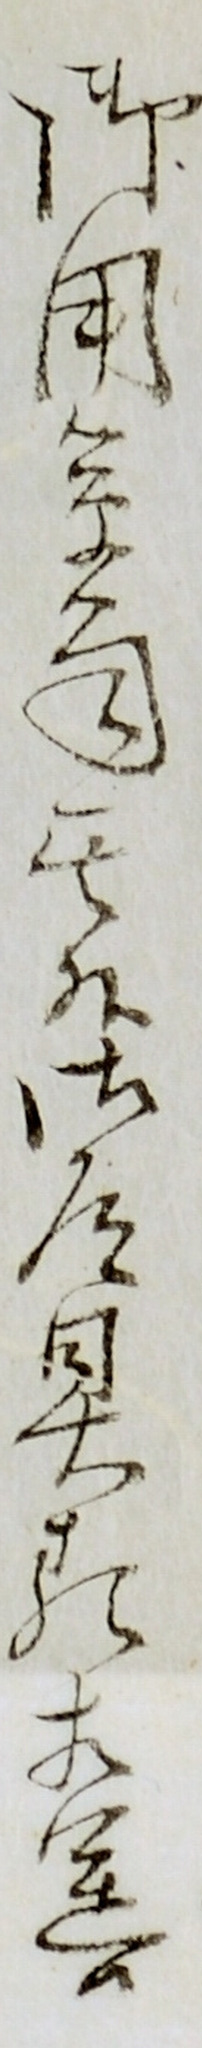御用箪笥其外御道具類相運候
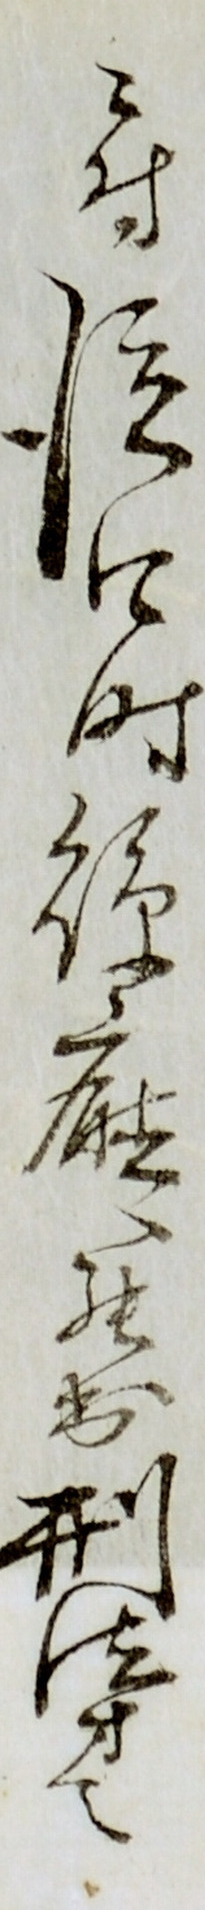に付従四時県庁へ罷出刑法方之
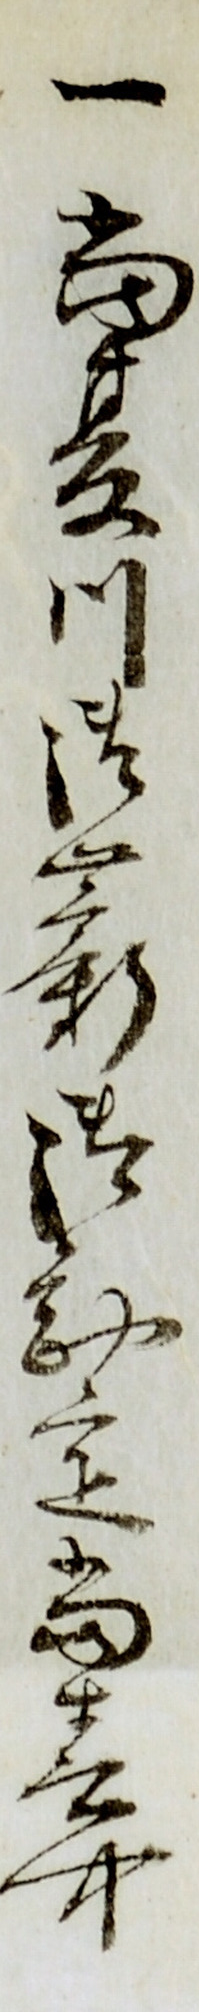一当夏川御薪御勘定当春中
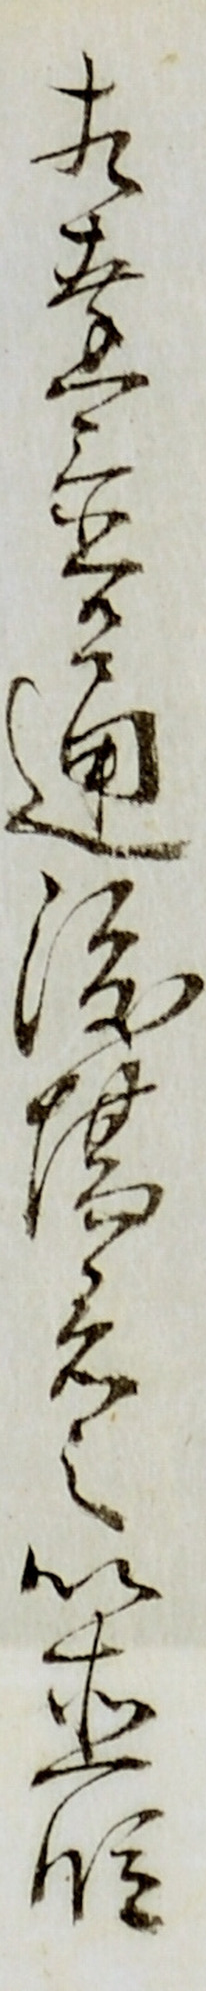相達置候通渡場着之以直段
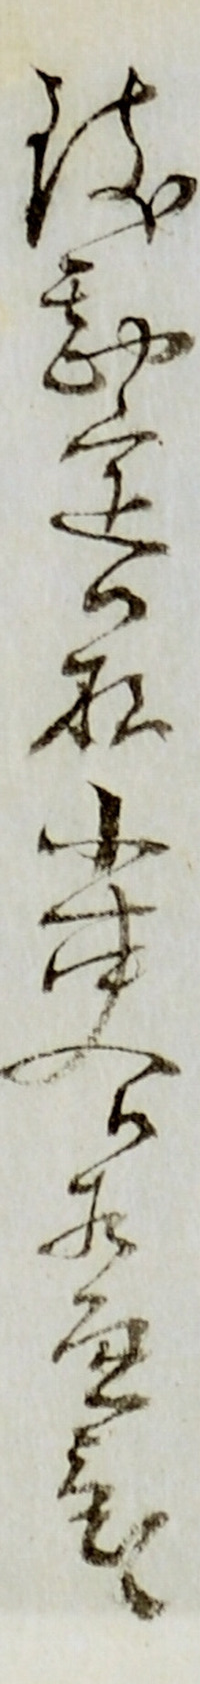致勘定候様小吏え相通置候
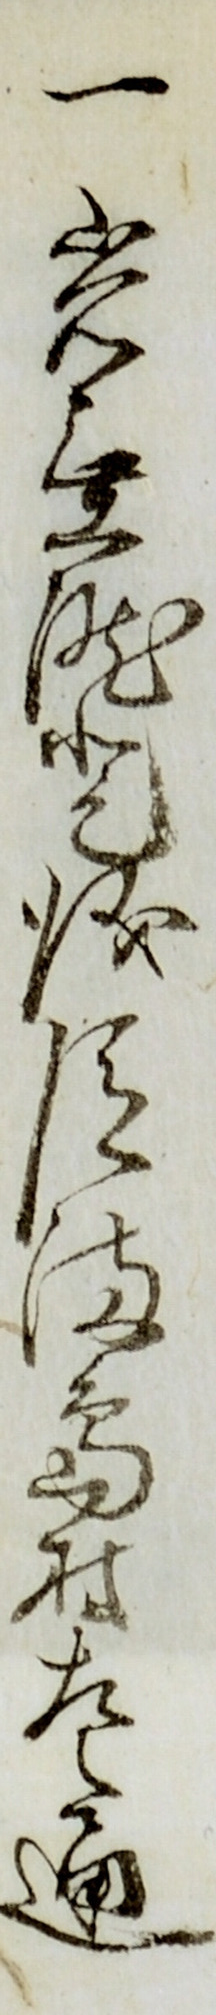一岩垂滝登儀従満島村左之通
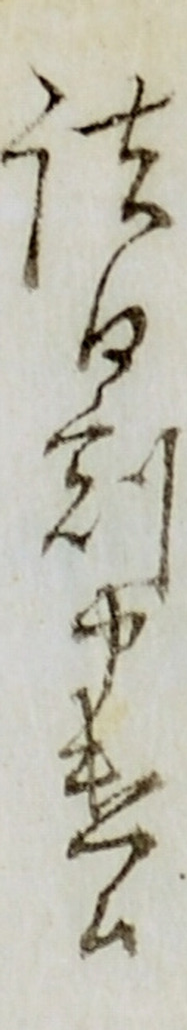諸日割申遣候
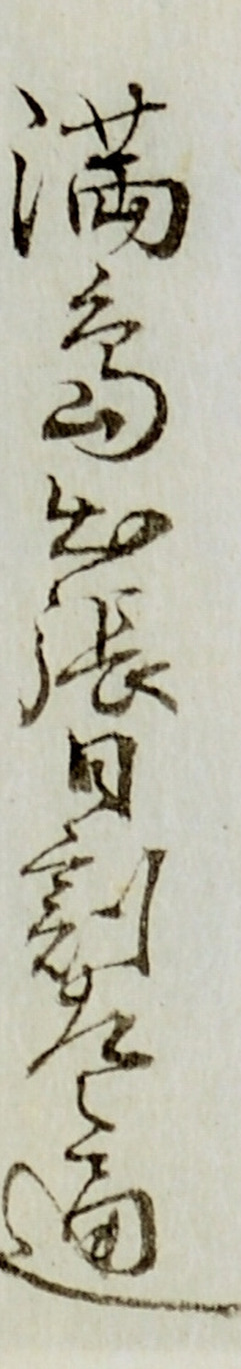満島出張日割左之通

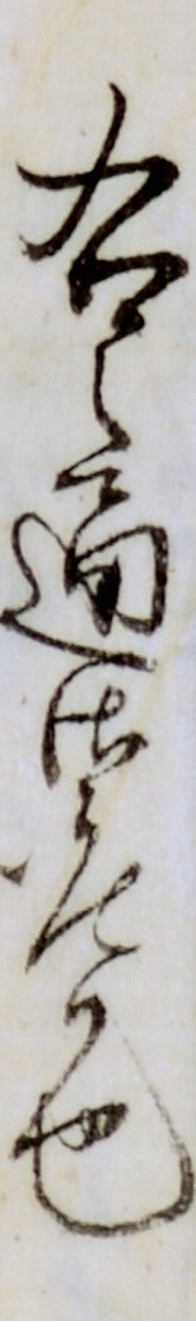右之通御座候也
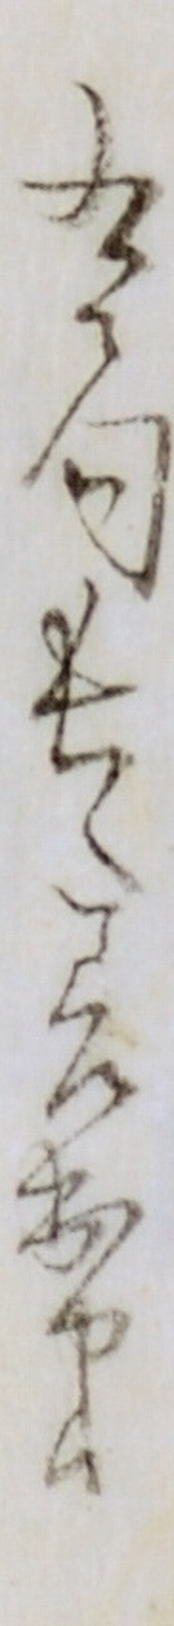右局長へ差出申候
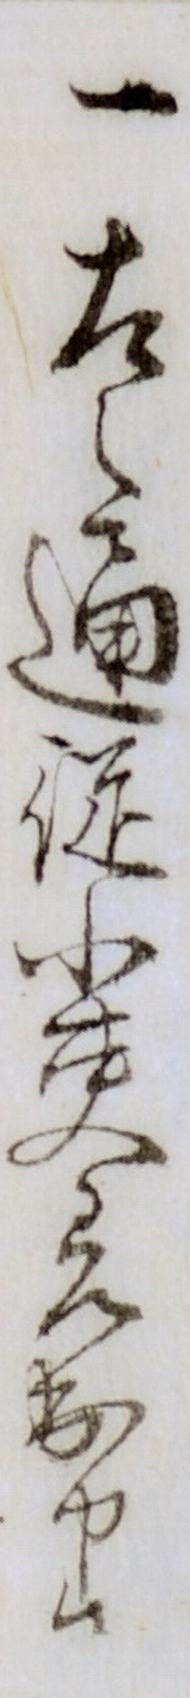一左之通従小吏差出申候
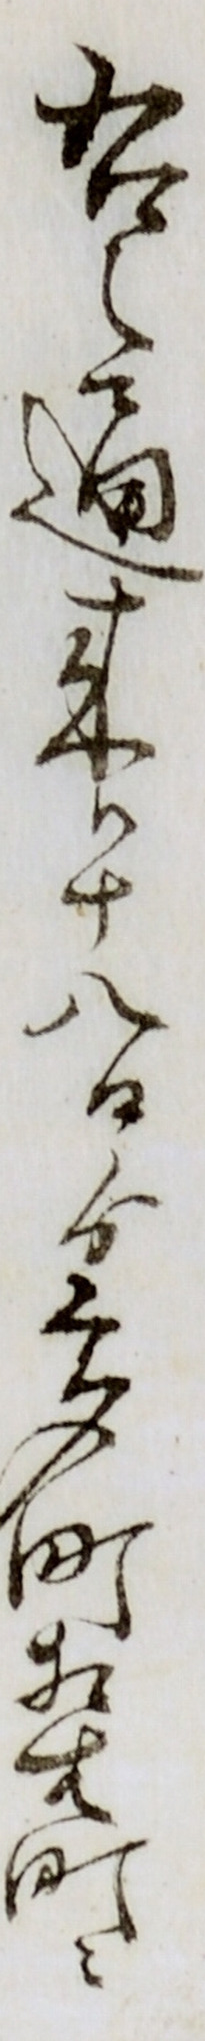右之通来ル十八日ゟ多町相生町に
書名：山林方諸事御用留
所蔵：伊那市立高遠町図書館・合同会社AMANE
